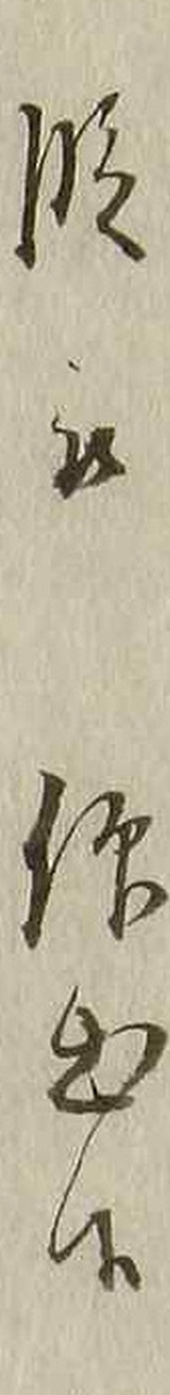段被仰出候
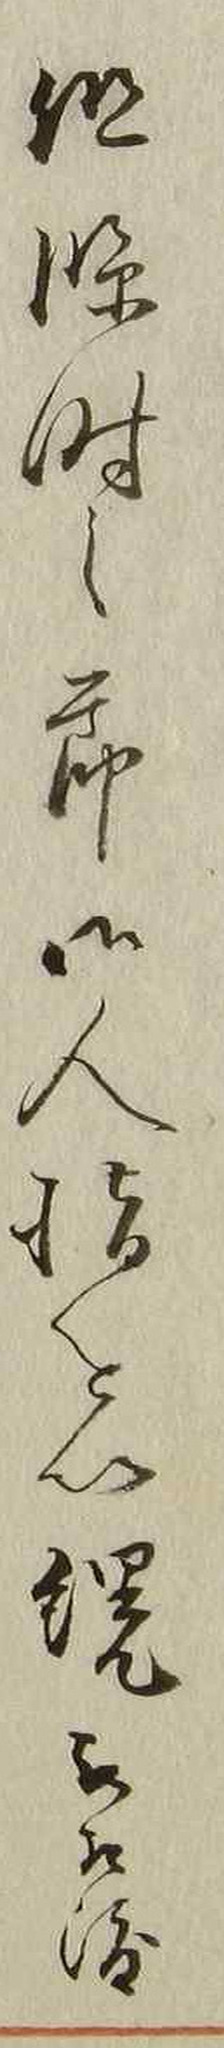但臨時之節御人指を以縨被相渡
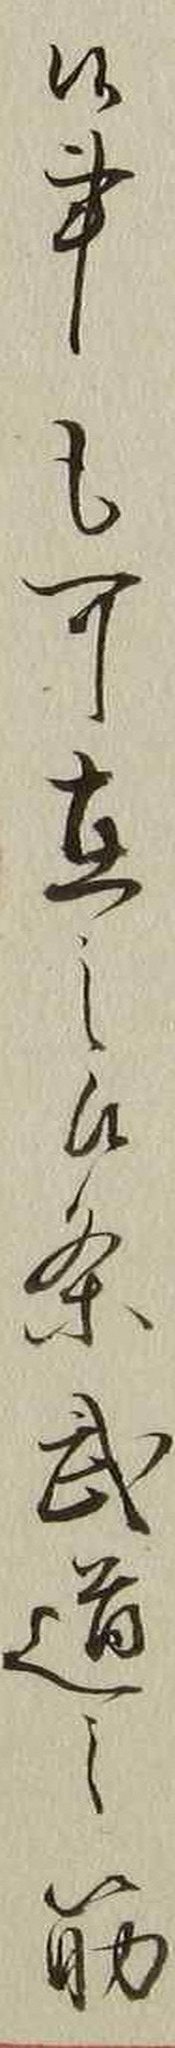候事も可在之候条武道之筋
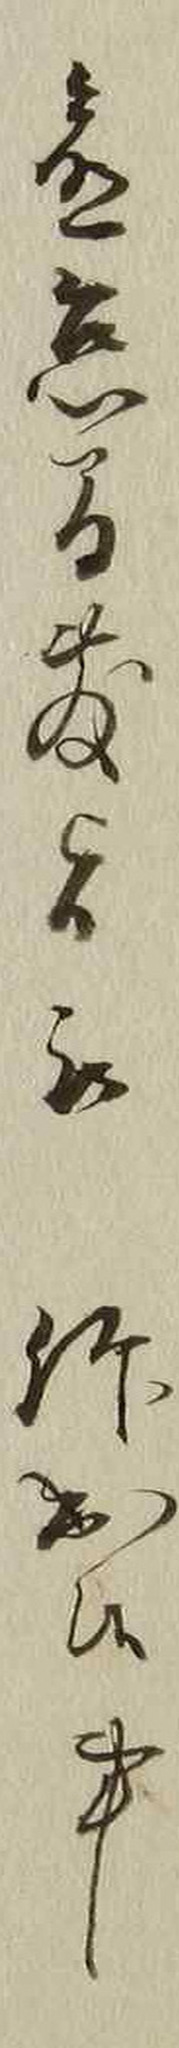有怠間敷旨被仰出候事
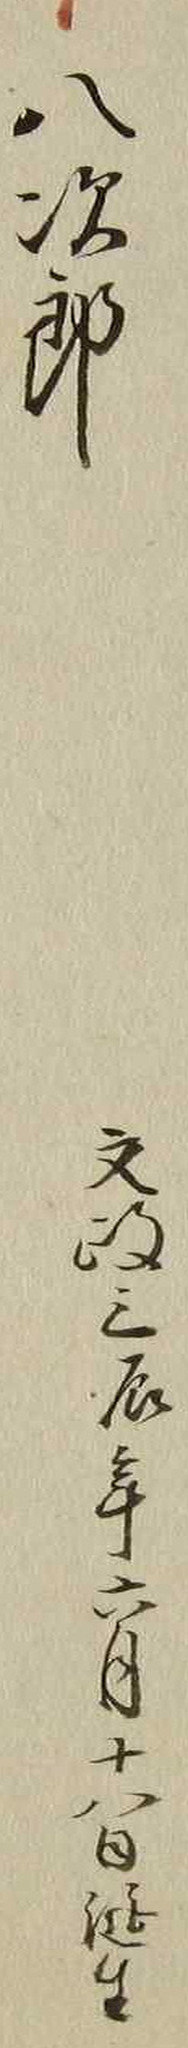八次郎文政三辰年六月十八日誕生
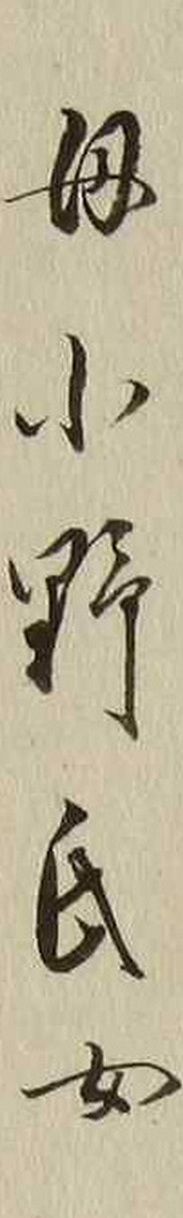母小野氏女

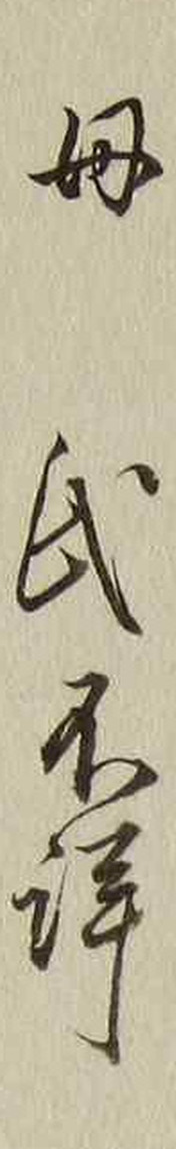母氏不詳
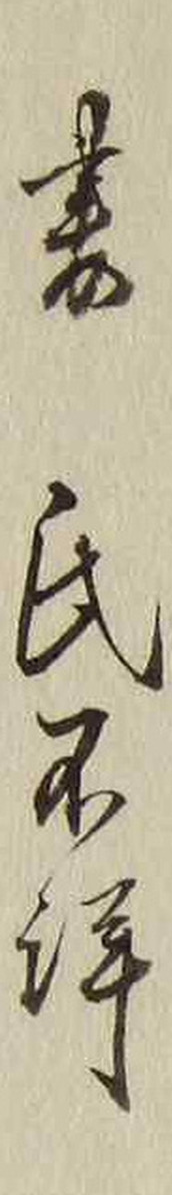妻氏不詳
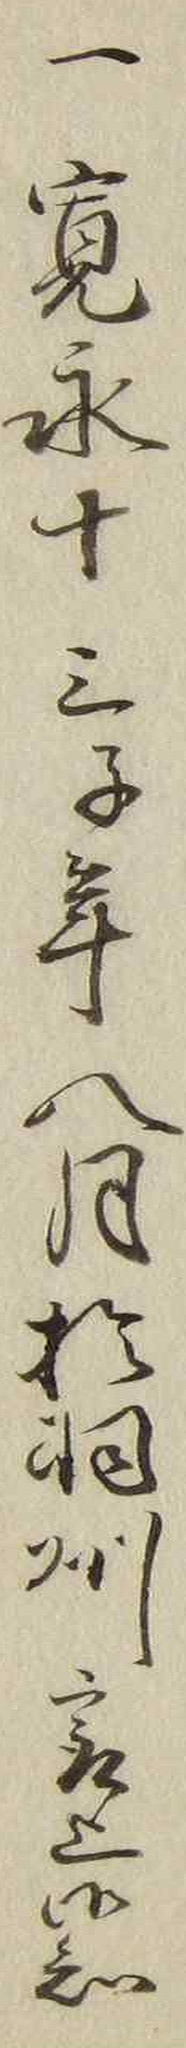一寛永十三子年八月於羽州最上御知

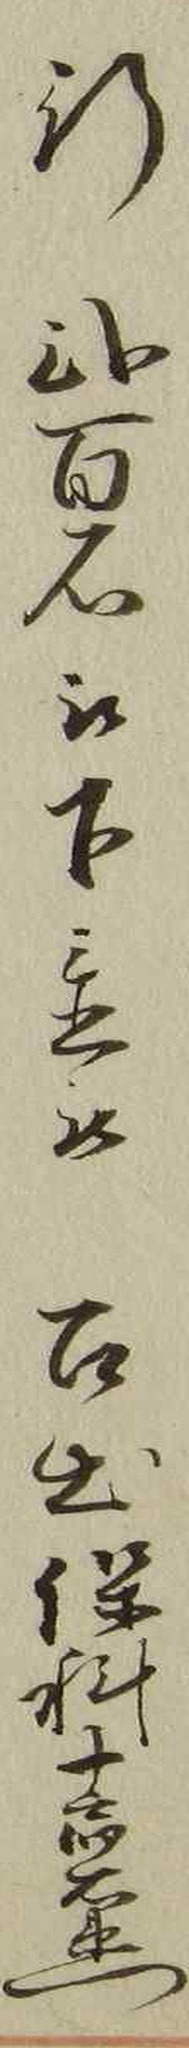行弐百石被下置被召出保科十郎右衛門
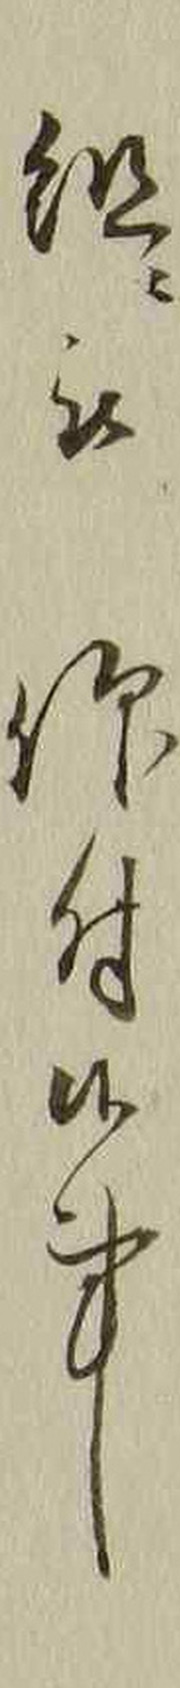組ニ被仰付候事
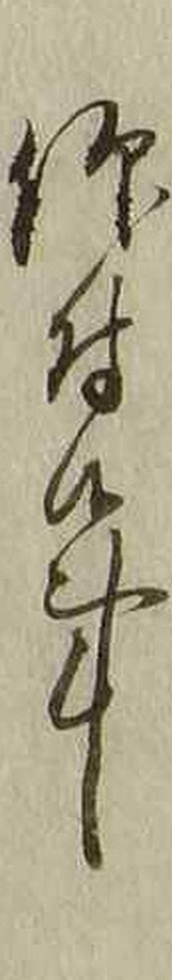仰付候事
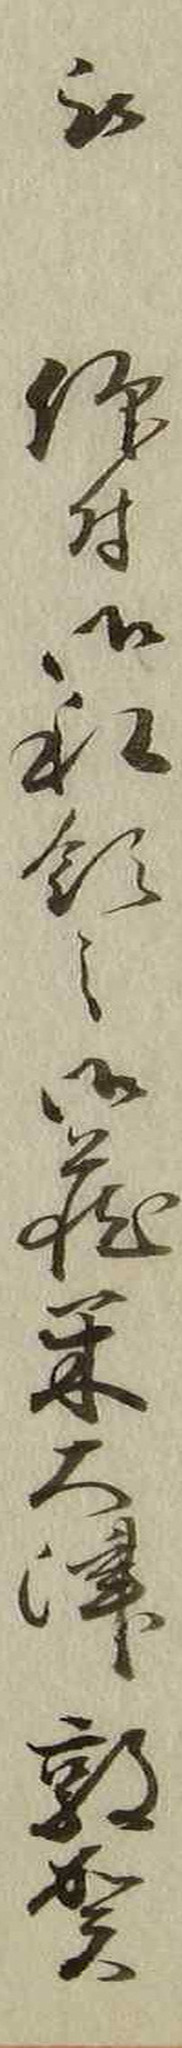被仰付御私領之御蔵米大津敦賀
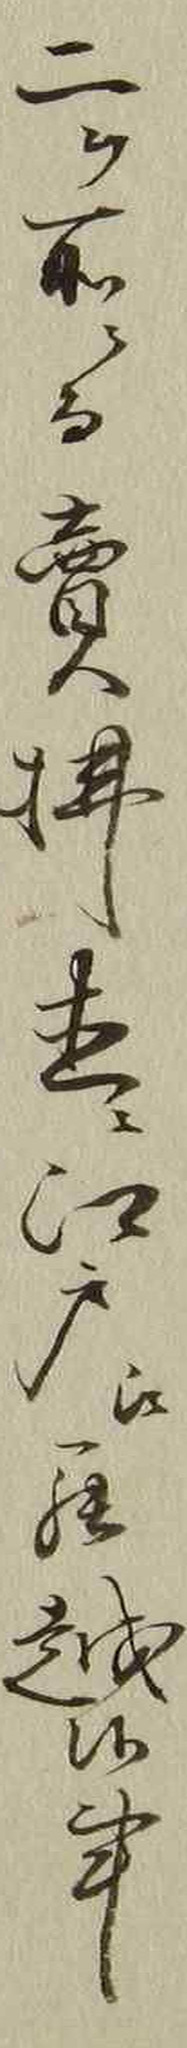二ヶ所ニ而売払直ニ江戸江罷越候事
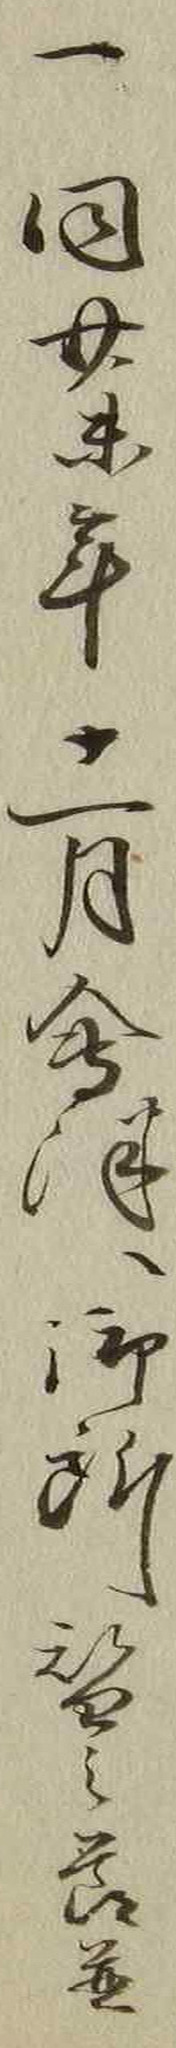一同廿未年十一月会津へ御所替之節並
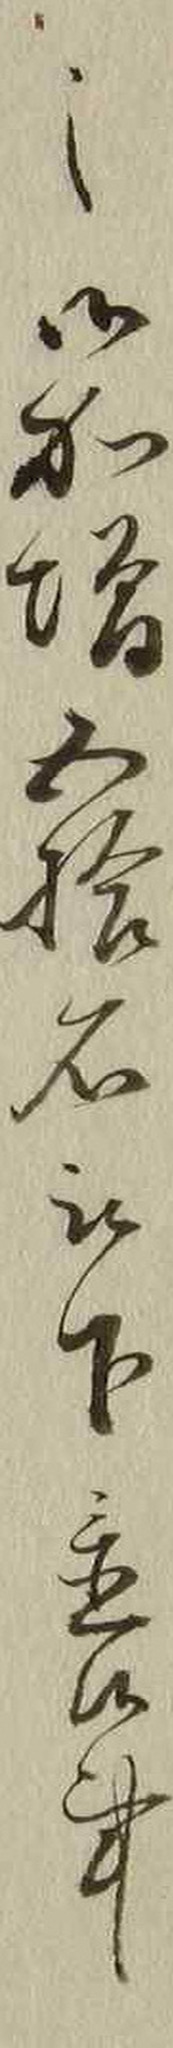之御加増五拾石被下置候事
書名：諸士系譜　巻之122　よ之部5
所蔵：会津若松市立会津図書館
